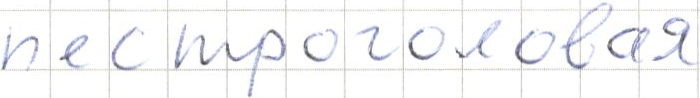пестроголовая
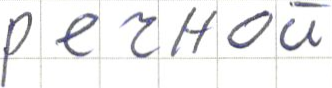речной
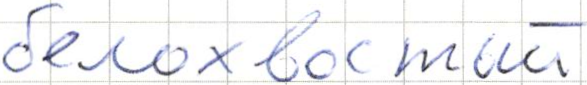белохвостый
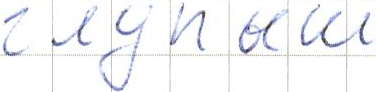глупыш
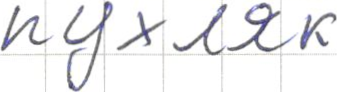пухляк
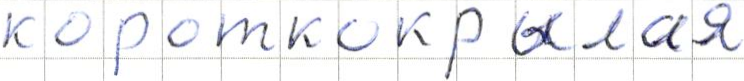короткокрылая
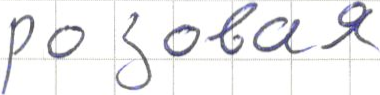розовая
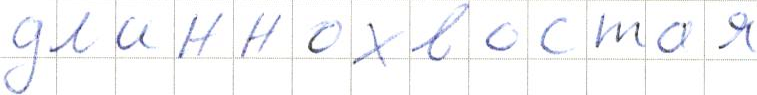длиннохвостая
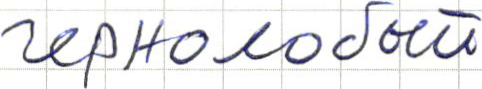чернолобый
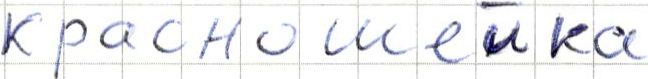красношейка
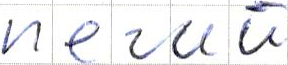пегий
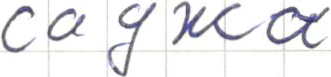саджа
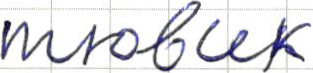тювик
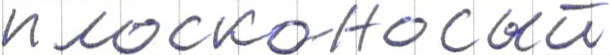плосконосый
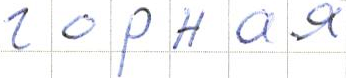горная
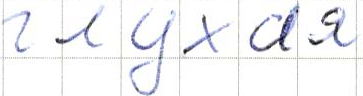глухая
